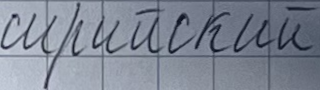сирийский
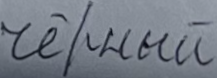чёрный
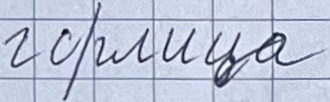горлица
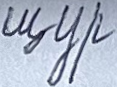щур
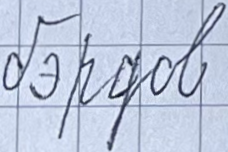бэрдов
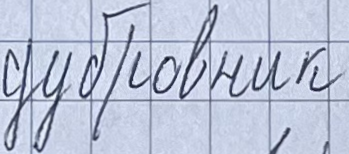дубровник
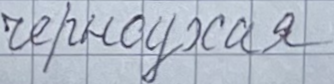черноухая
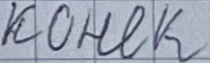конек
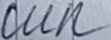сип
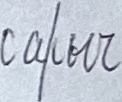сарыч
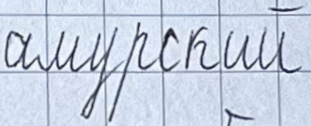амурский
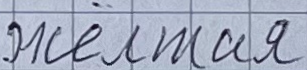жёлтая
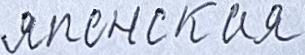японская
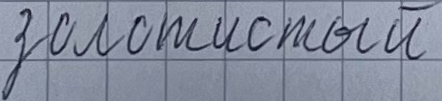золотистый
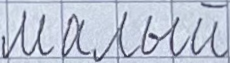малый
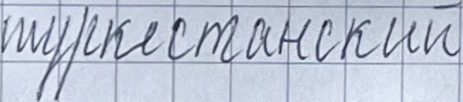туркестанский
